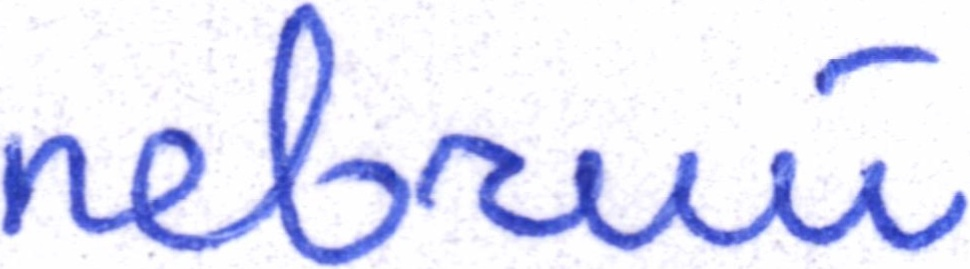певчий
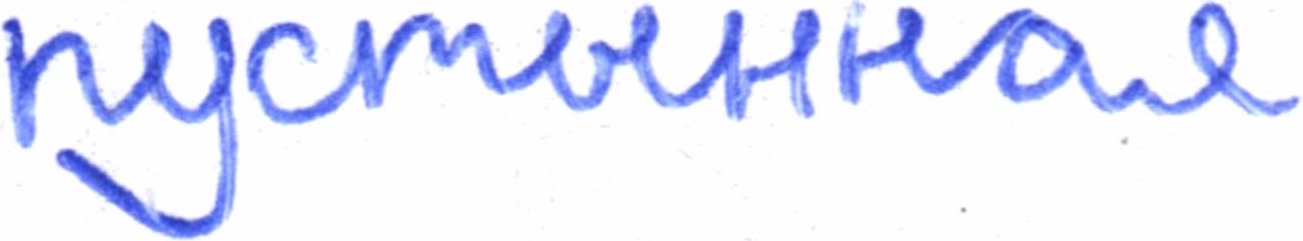пустынная
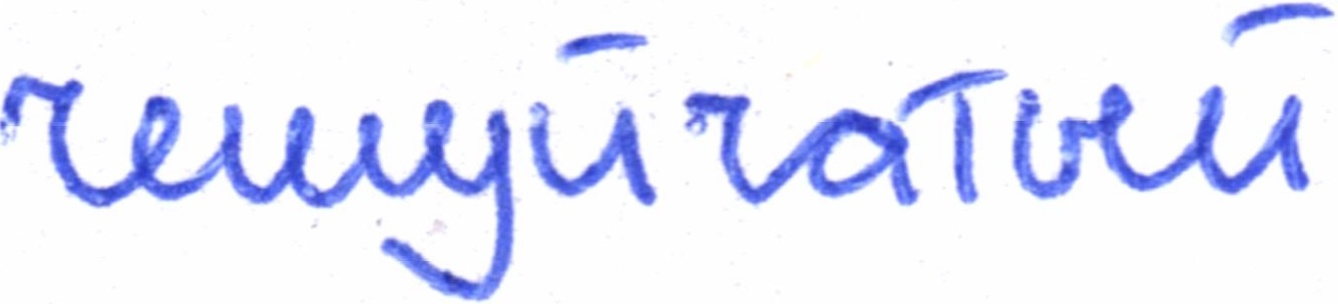чешуйчатый
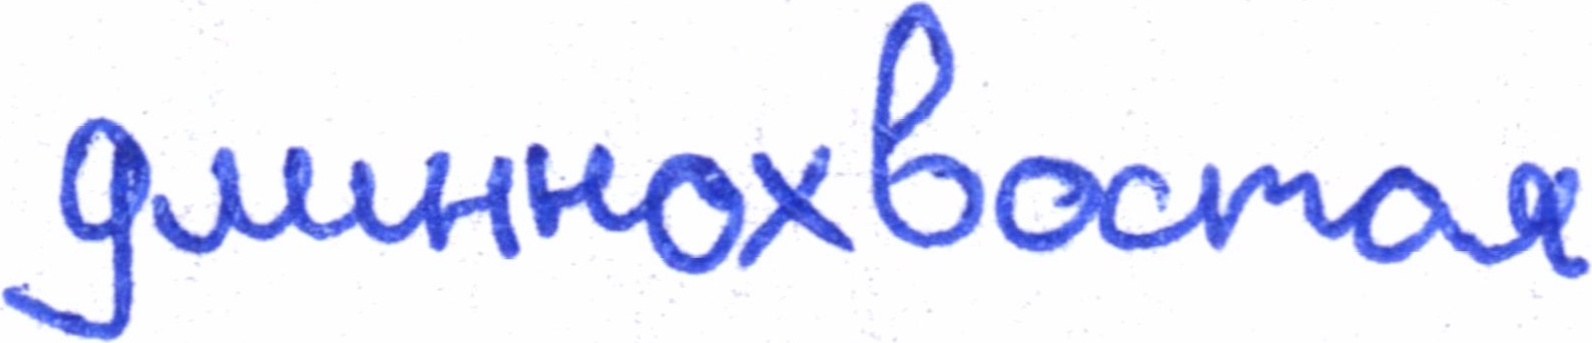длиннохвостая
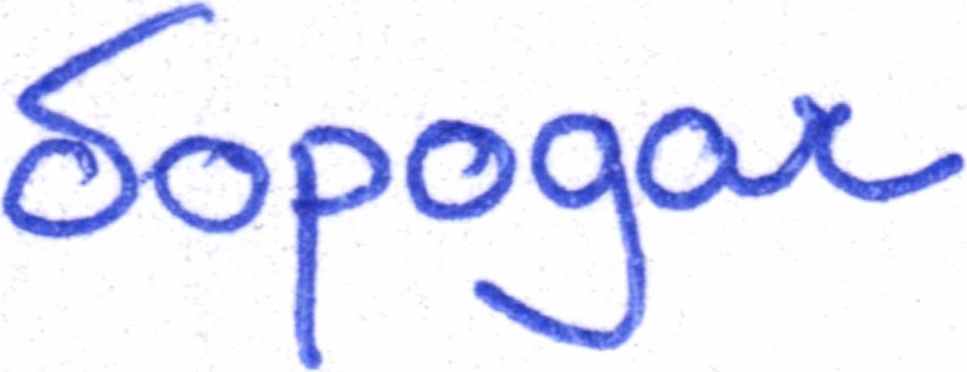бородач
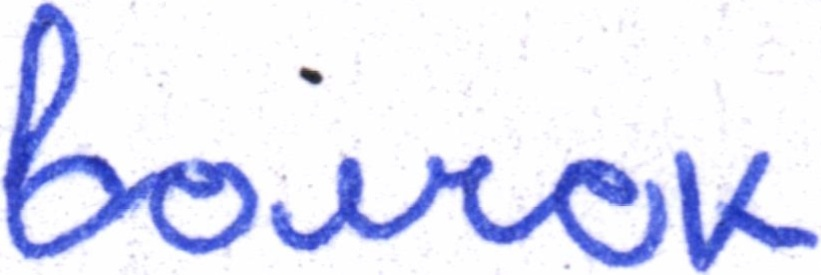волчок
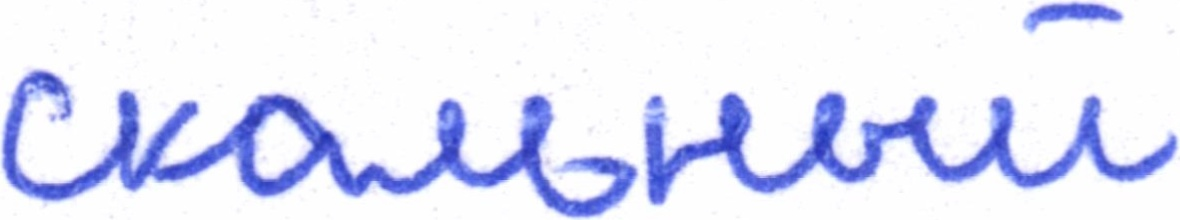скальный
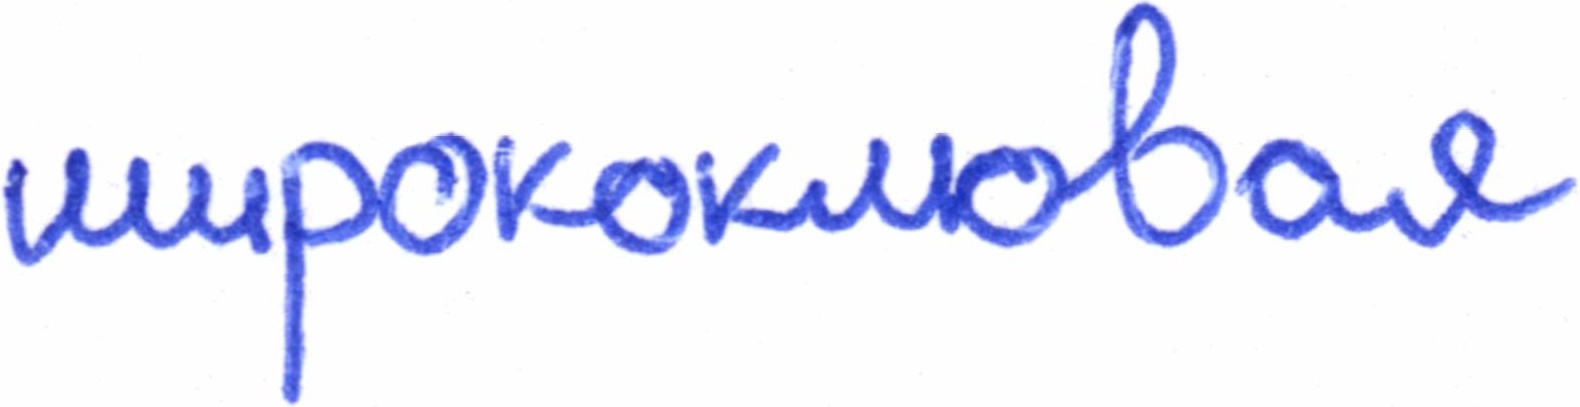ширококлювая
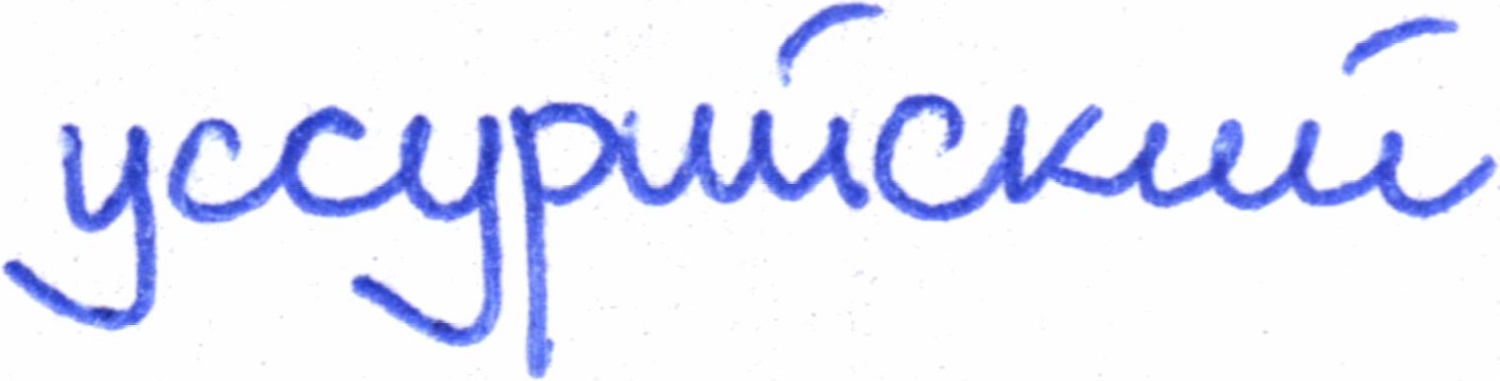уссурийский
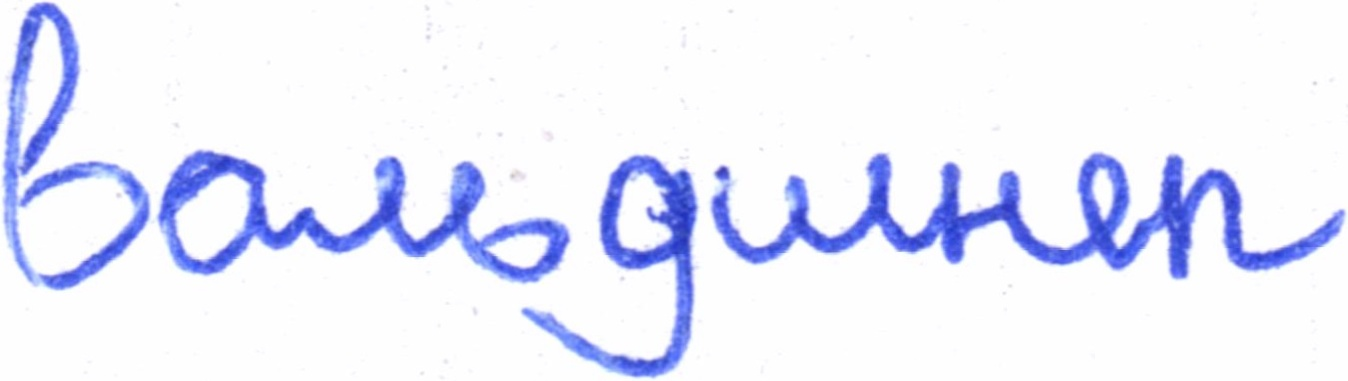вальдшнеп
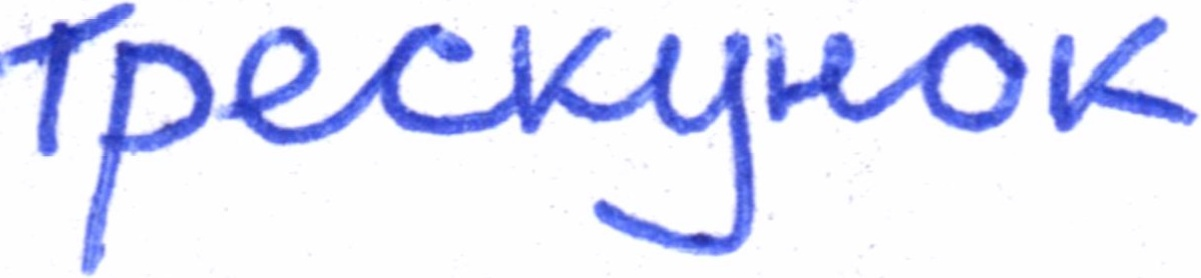трескунок
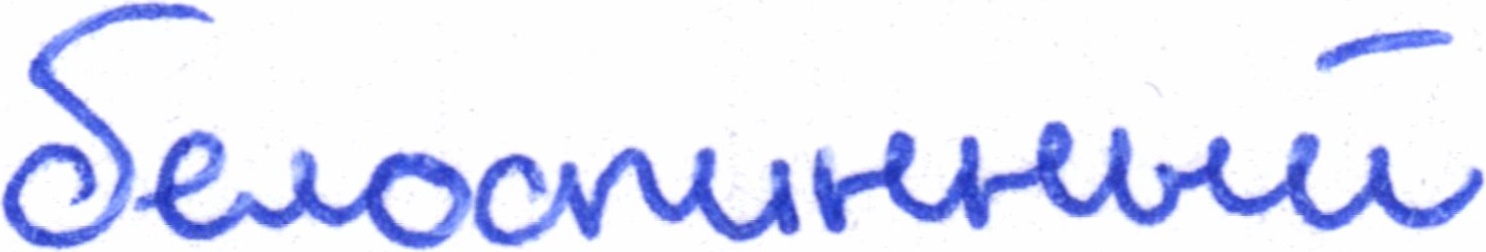белоспинный
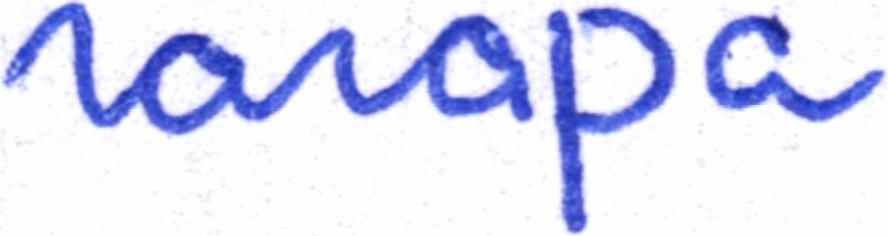гагара
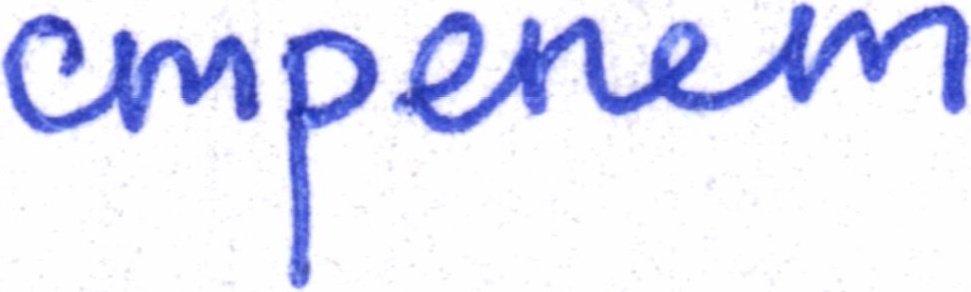стрепет
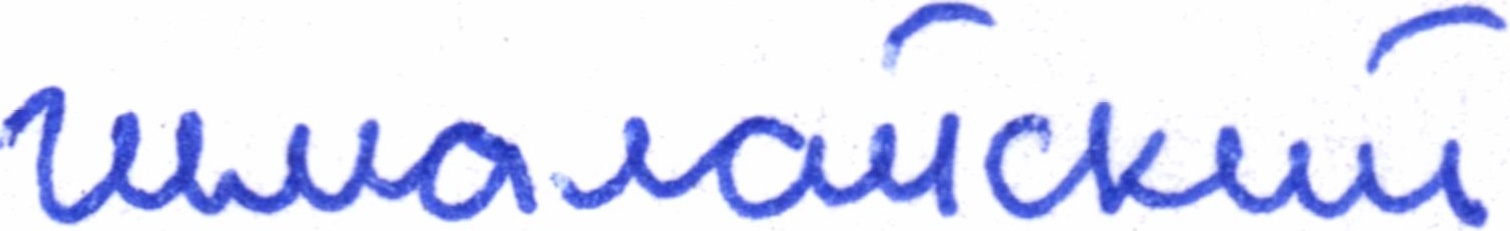гималайский
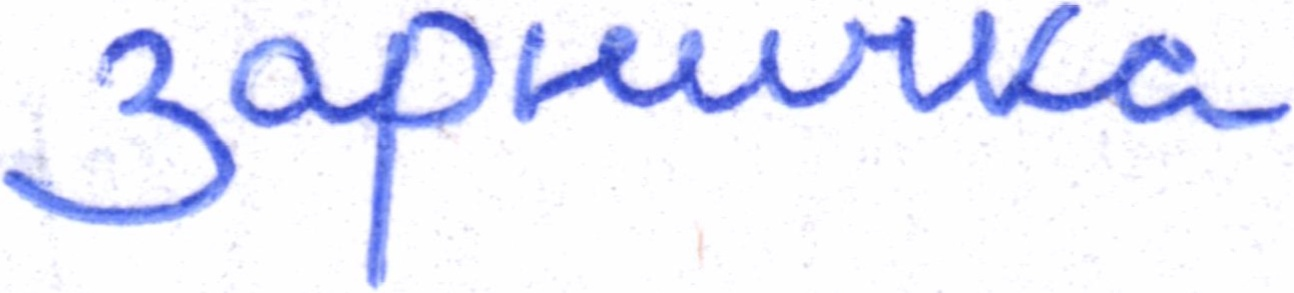зарничка
